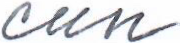сип
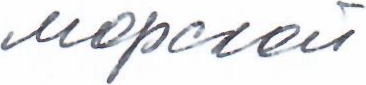морской
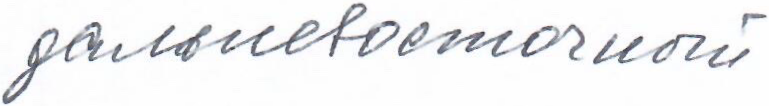дальневосточный
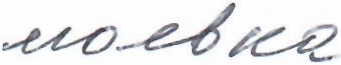моевка
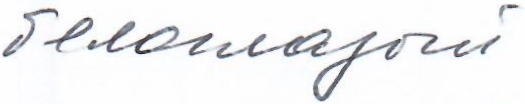белоглазый
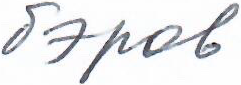бэров
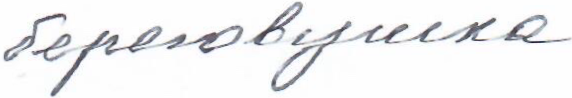береговушка
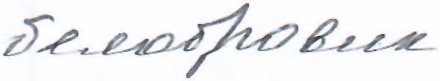белобровик
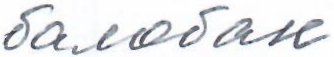балобан
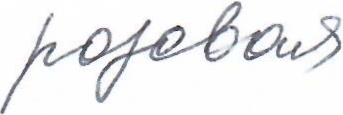розовая
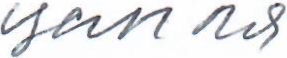цапля
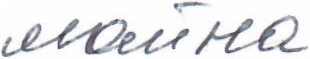майна
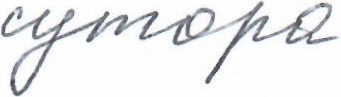сутора
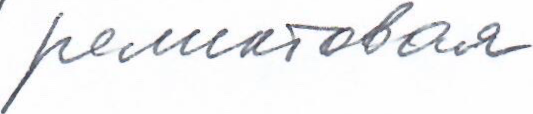реликтовая
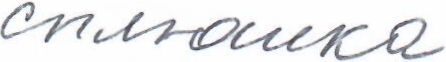сплюшка
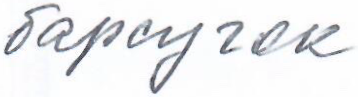барсучок
